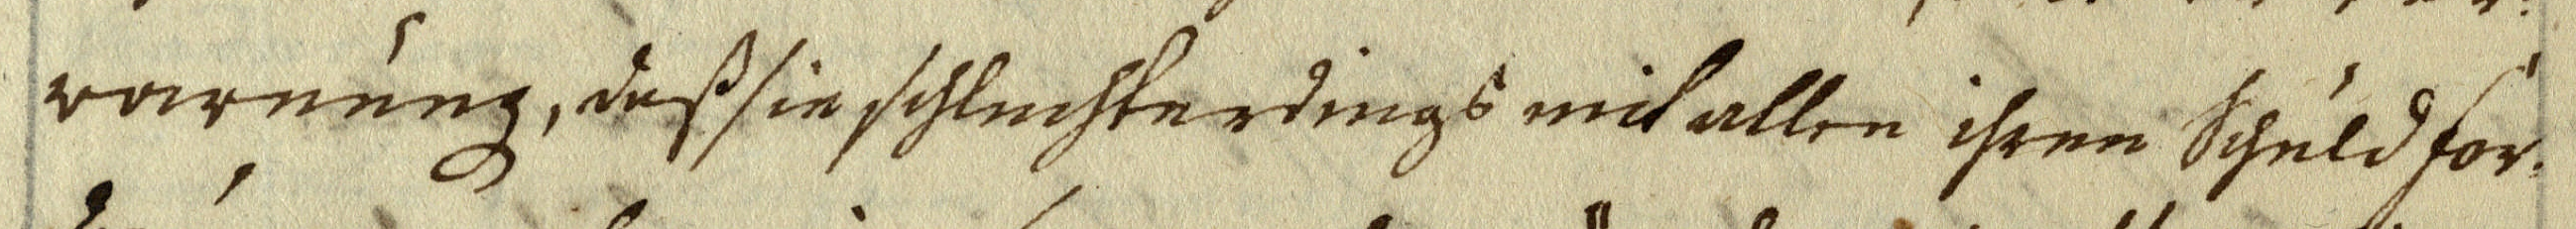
warnung, daß sie schlechterdings mit allen ihren Schuldfor¬
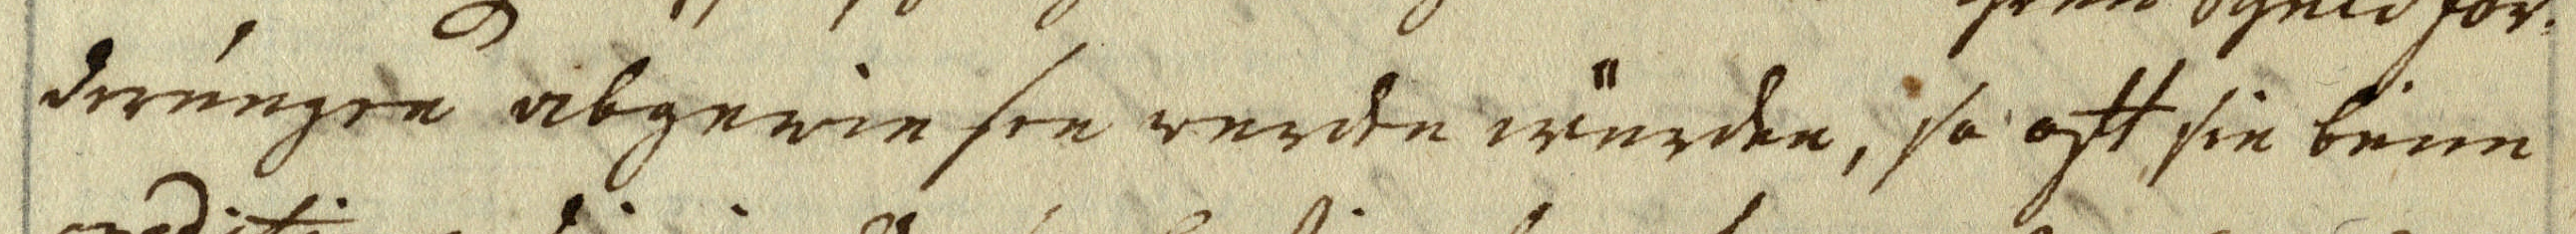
derungen abgewiesen werden würden, so oft sie beim
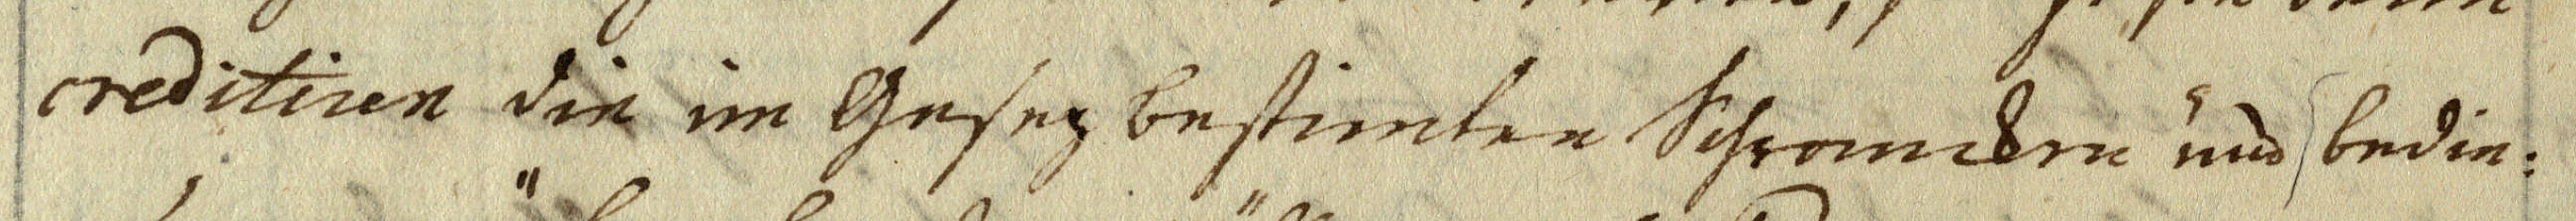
creditiren die im Gesez bestimten Schrancken und bedin¬
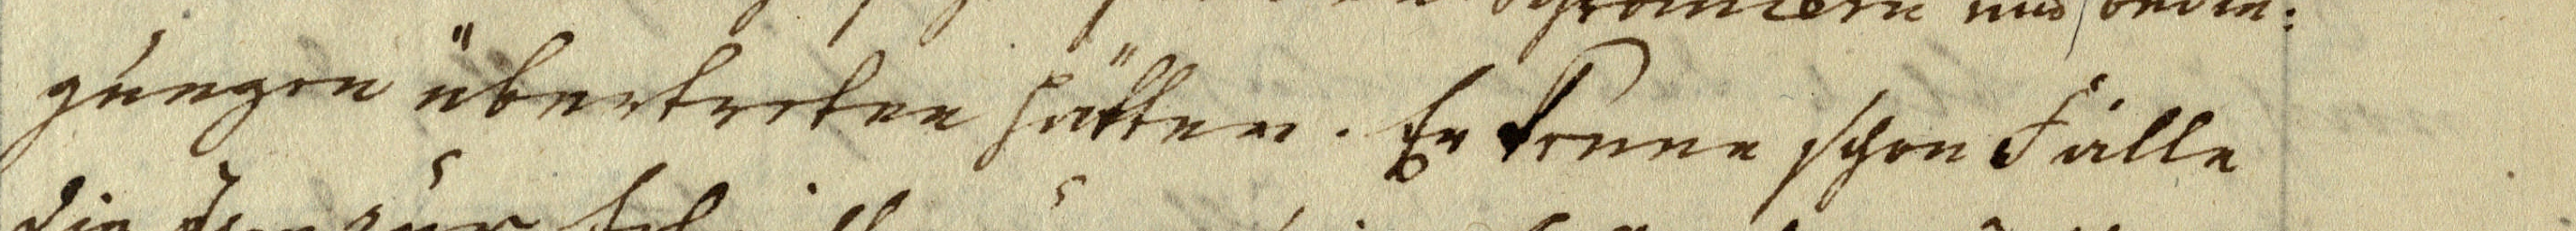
gungen übertreten hätten. Er kenne schon Fälle
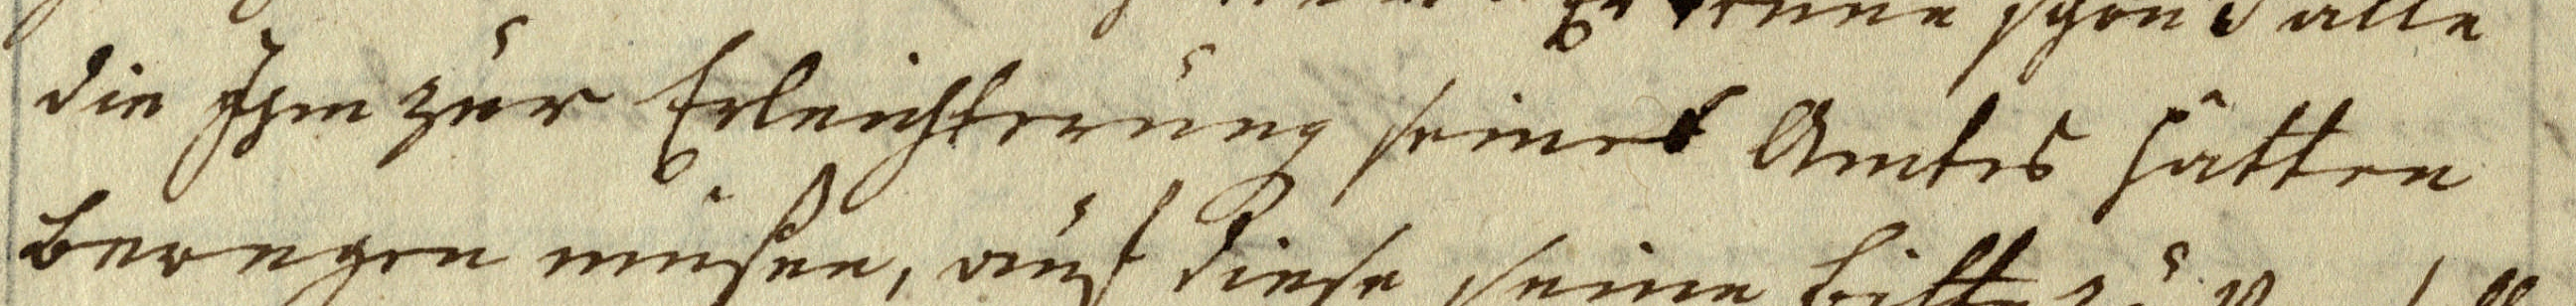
die Ihm zur Erleichterung seines Amtes hätten
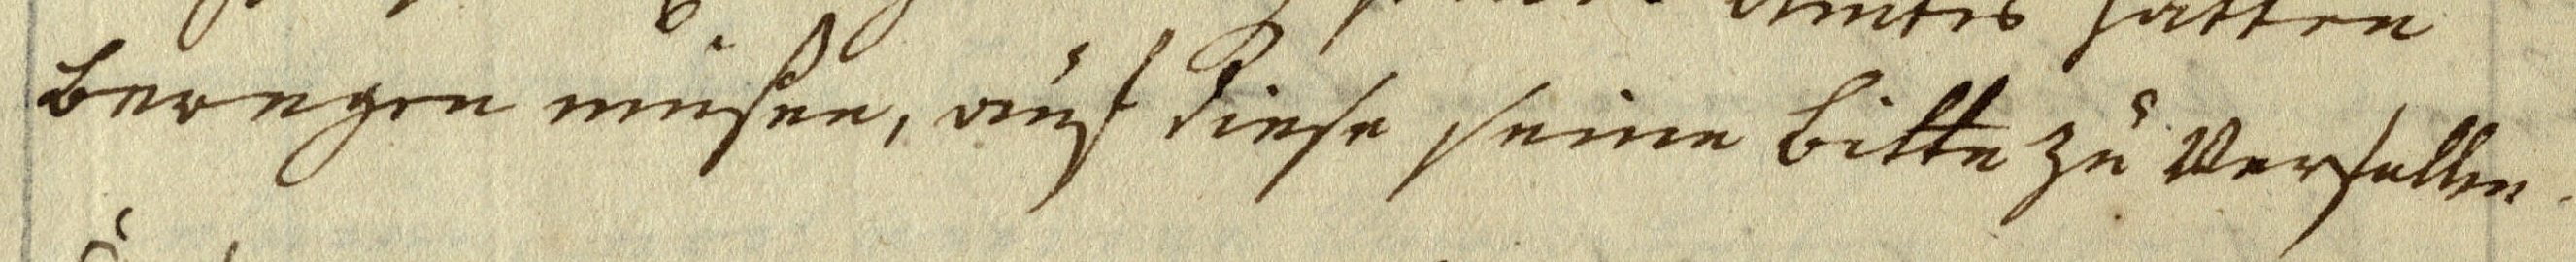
bewegen müßen, auf diese seine Bitte zu verfallen.
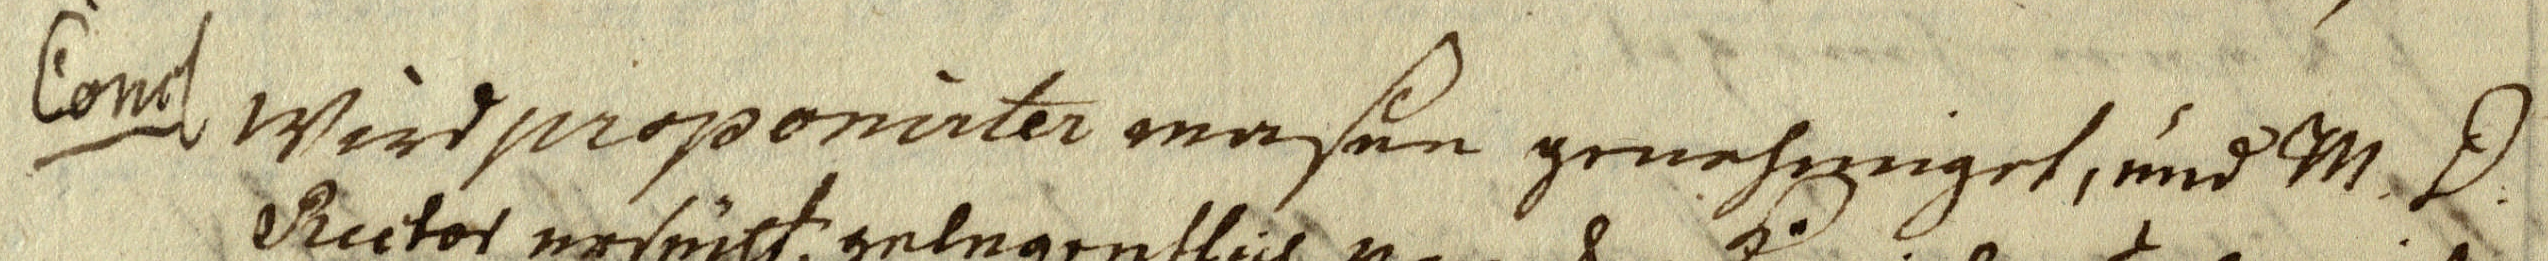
Concl Wird proponirter maßen genehmiget, und M.D.
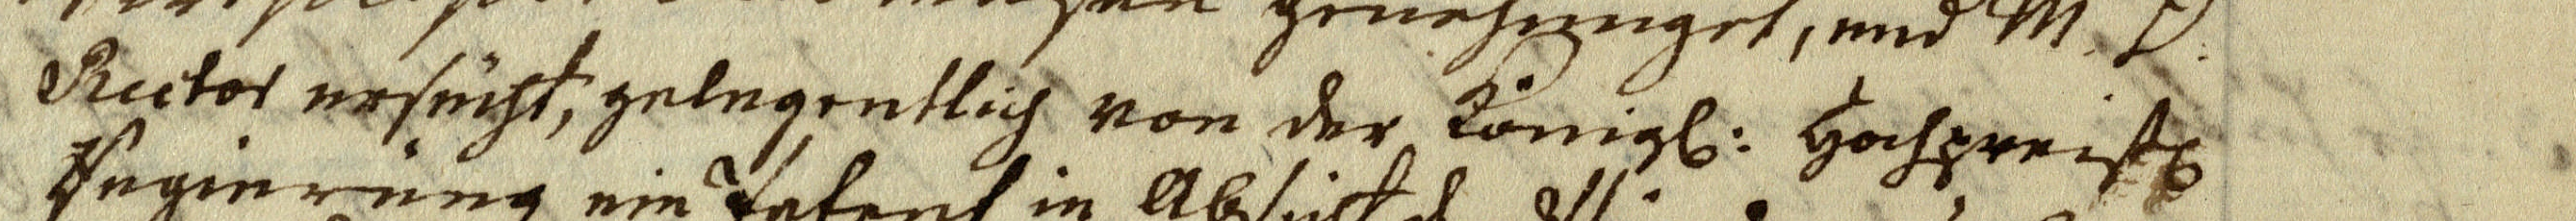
Rector ersucht, gelegentlich von der Königl: Hochpreißl.
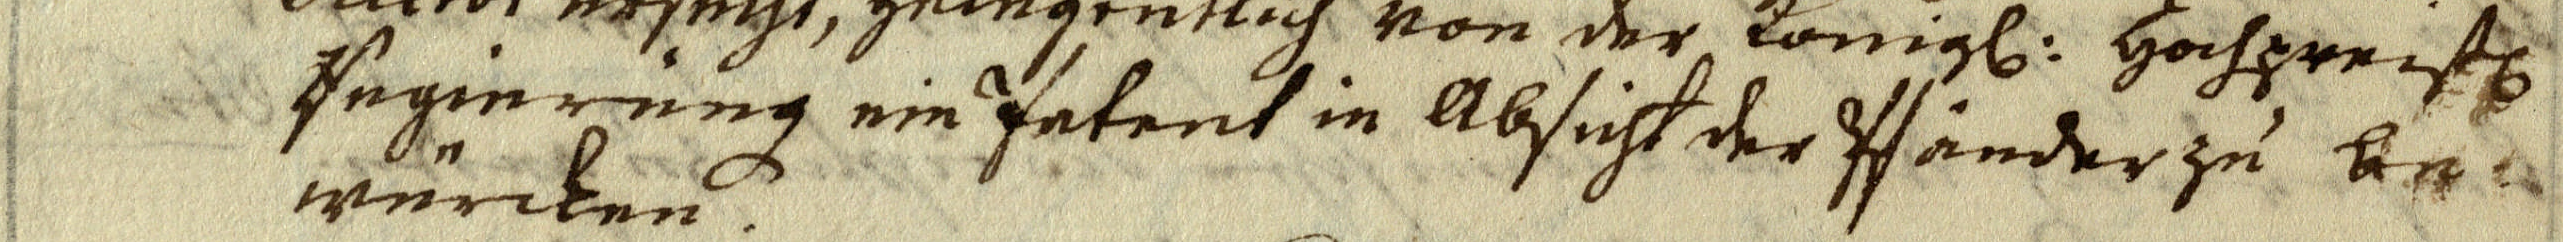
Regierung ein Patent in Absicht der Pfänder zu be¬
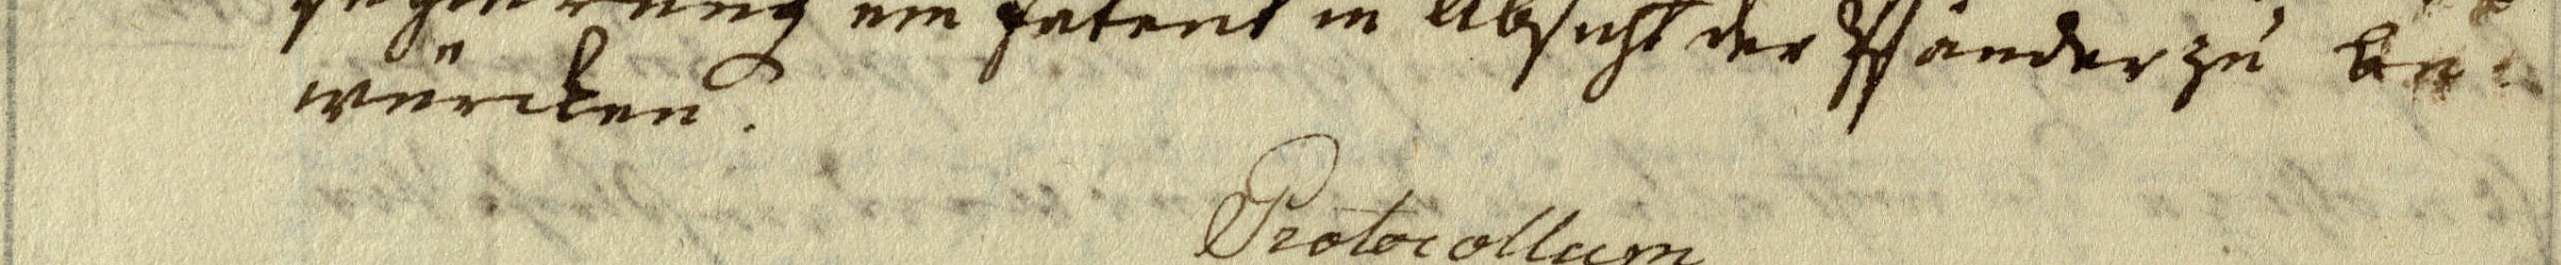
würcken.
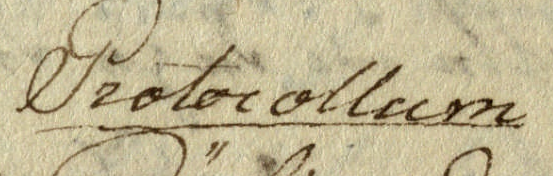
Protocollum
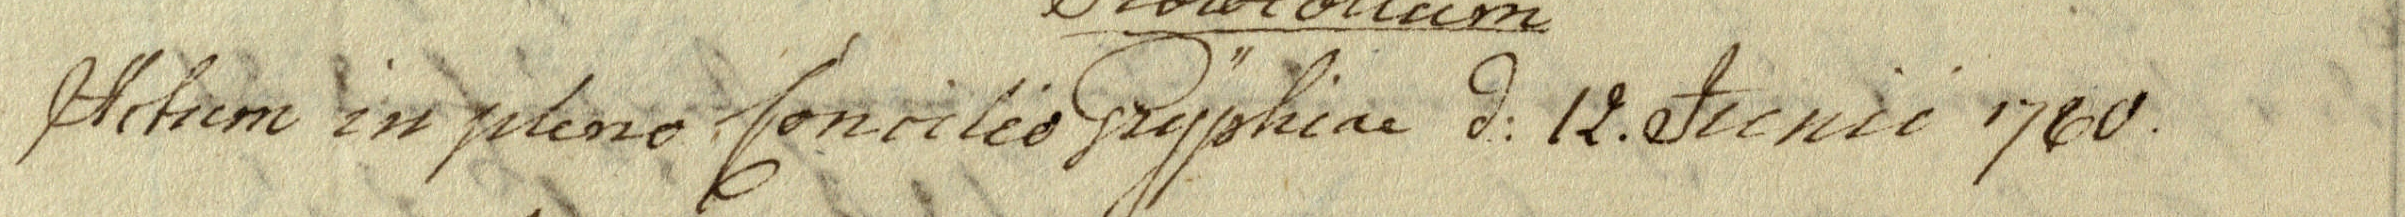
Actum in pleno Concilio Grÿphicae d.12. Junii 1780
